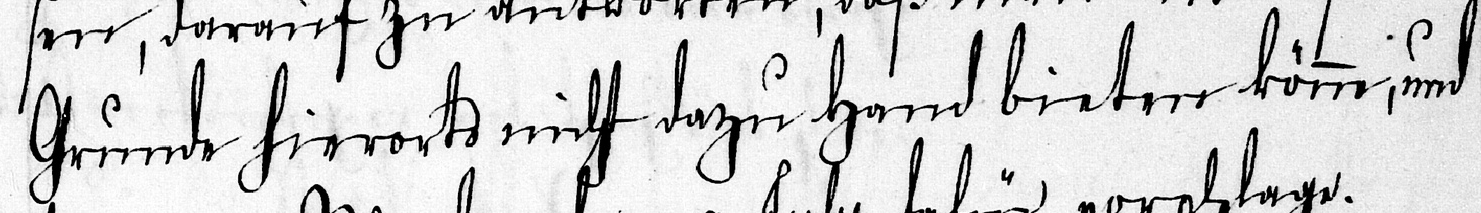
Grunde hierorts nicht dazu Hand bieten könne,
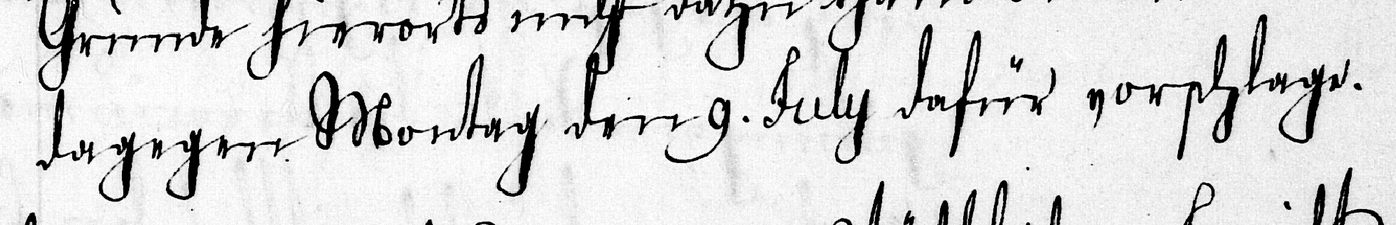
dagegen Montag den 9. July dafür vorschlage.
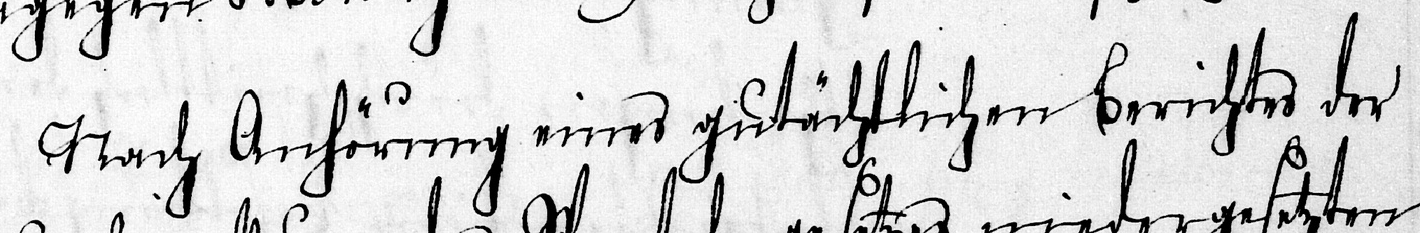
Nach Anhörung eines gutächtlichen Berichtes der
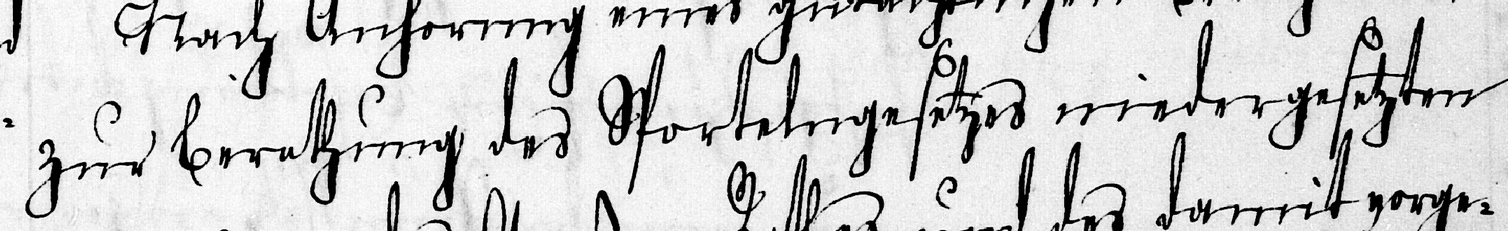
zur Berathung des Sportelngesetzes niedergesetzten
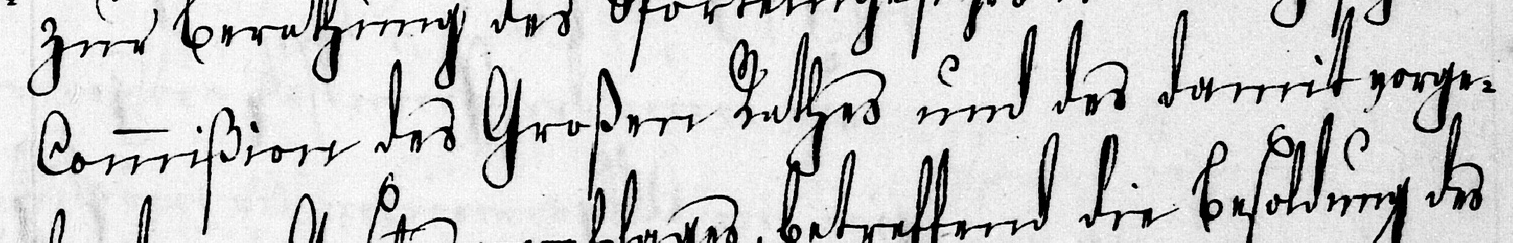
Commißion des Großen Rathes und des damit vorge¬
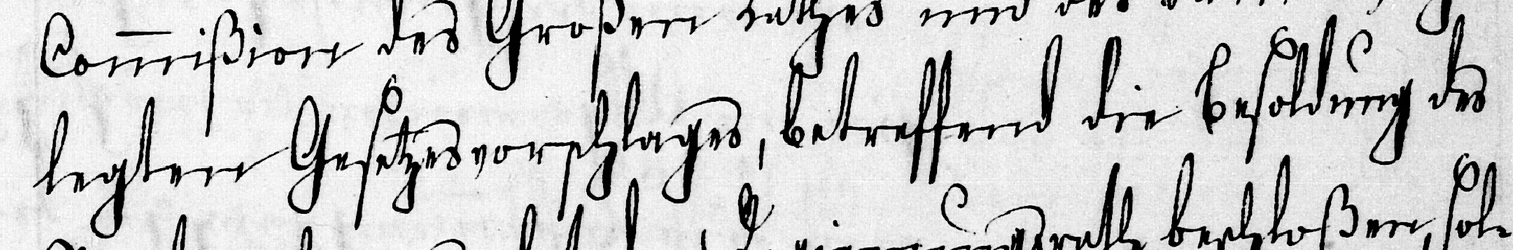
legten Gesetzesvorschlages, betreffend die Besoldung des
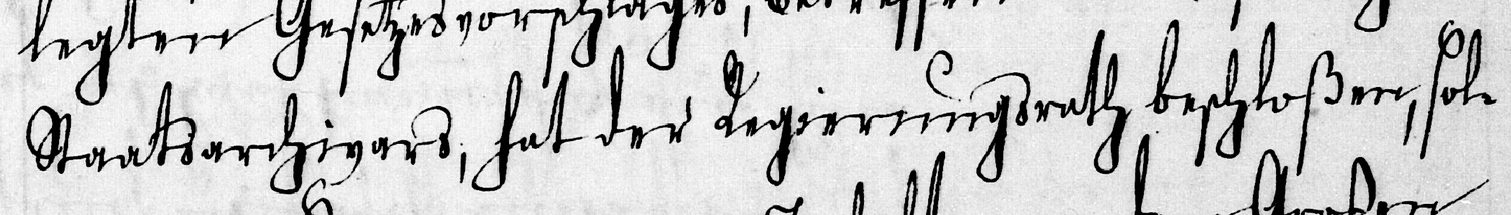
Staatsarchivars, hat der Regierungsrath beschloßen, sol¬
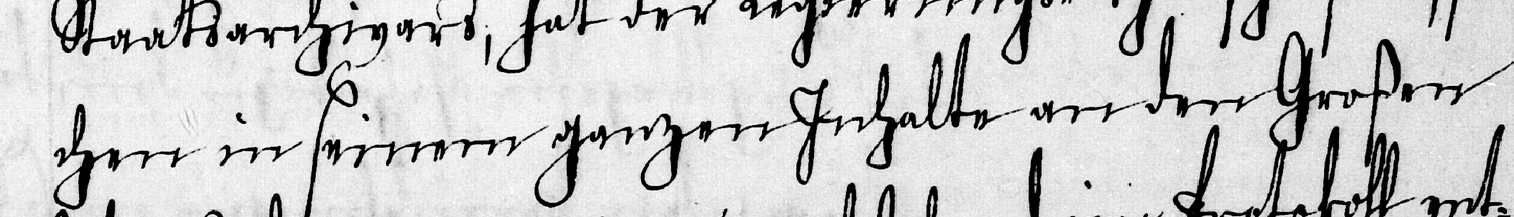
chen in seinem ganzen Inhalte an den Großen
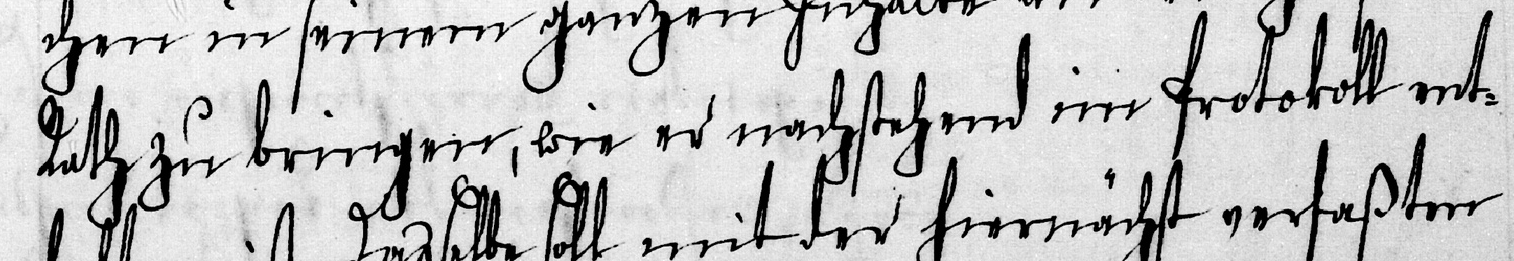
Rath zu bringen, wie er nachstehend im Protokoll ent¬
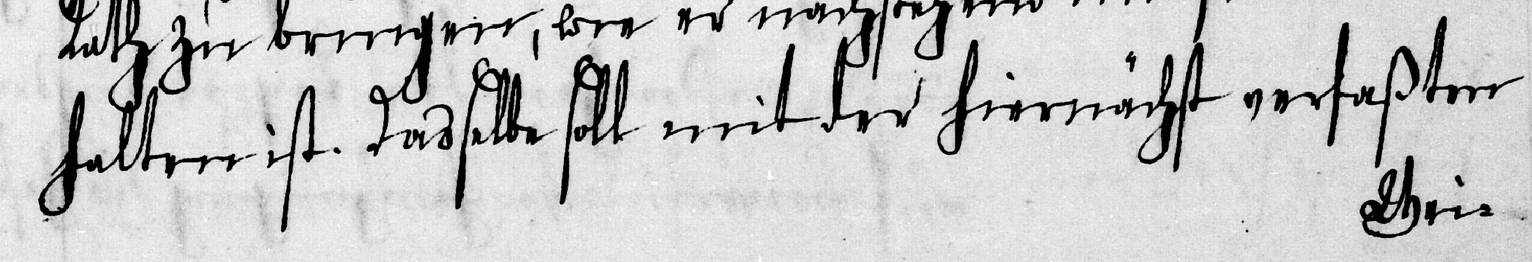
halten ist. Dasselbe soll mit der hiernächst verfaßten
